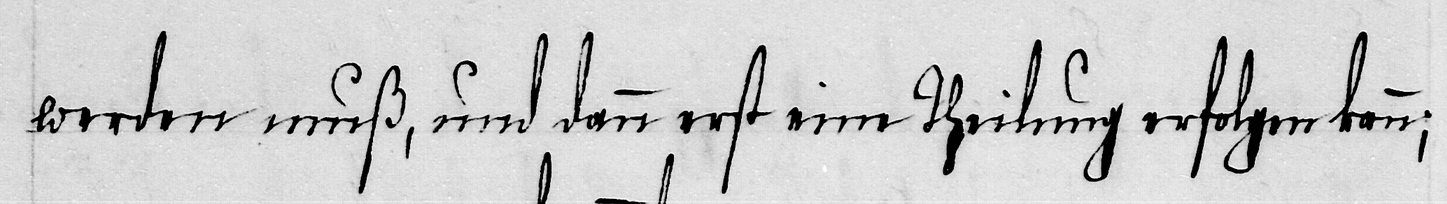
werden muß, und dann erst eine Theilung erfolgen
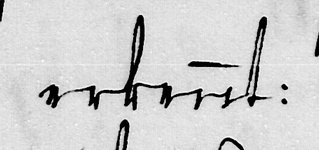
erkennt:
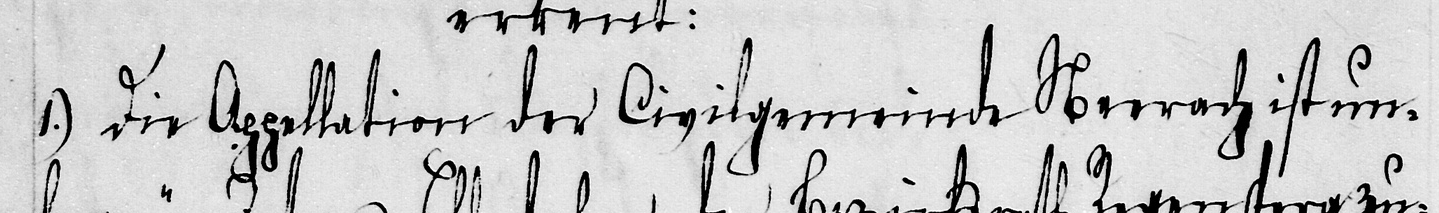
1.) Die Appellation der Civilgemeinde Neerach ist un¬
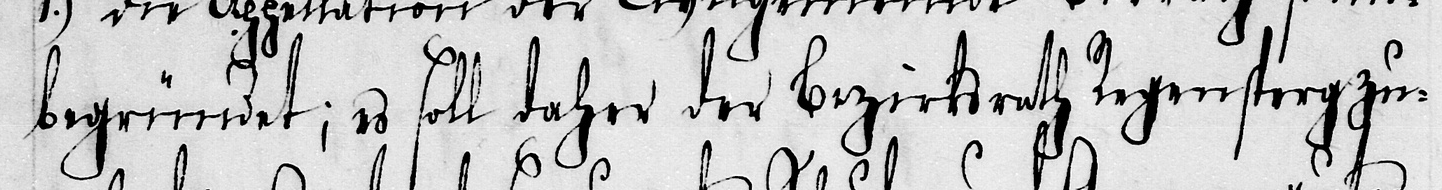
begründet; es soll daher der Bezirksrath Regensperg zu¬
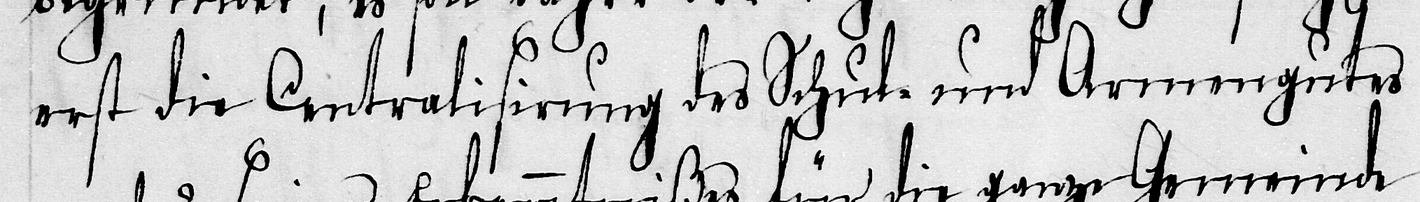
erst die Centralisirung des Schul- und Armengutes
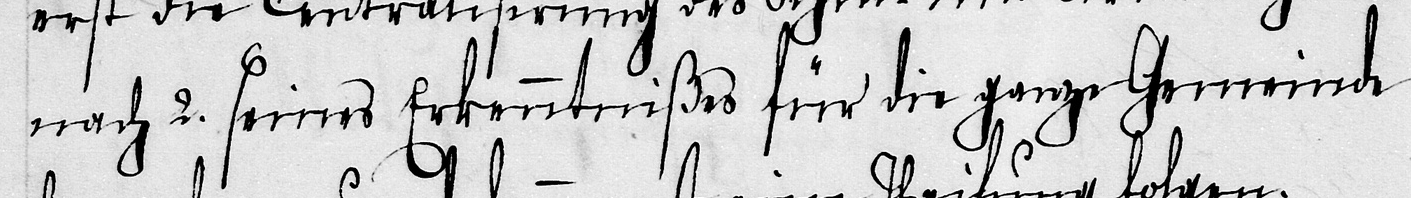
nach 2. seines Erkenntnißes für die ganze Gemeinde
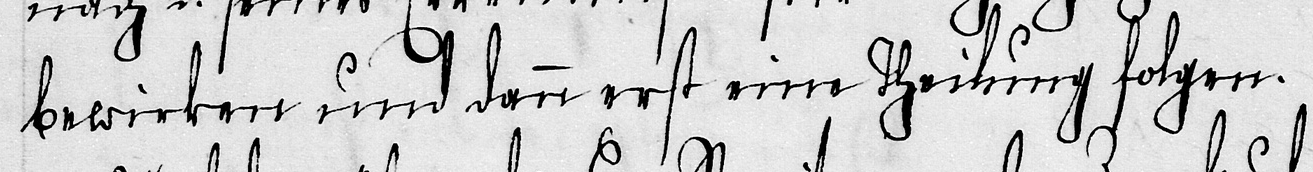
bewirken und dann erst eine Theilung folgen.
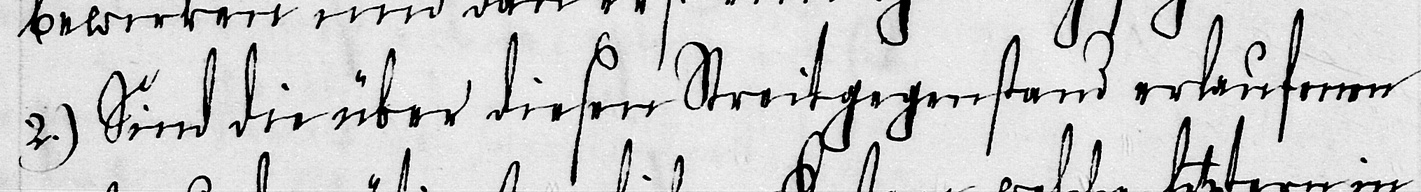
2.) Sind die über diesen Streitgegenstand erlaufenen
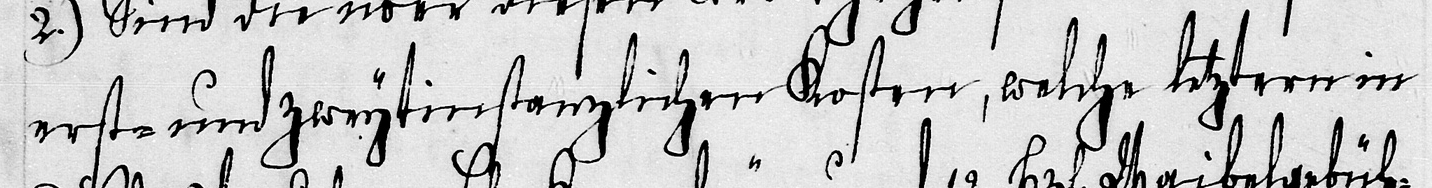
erst- und zweitinstanzlichen Kosten, welche letztern in
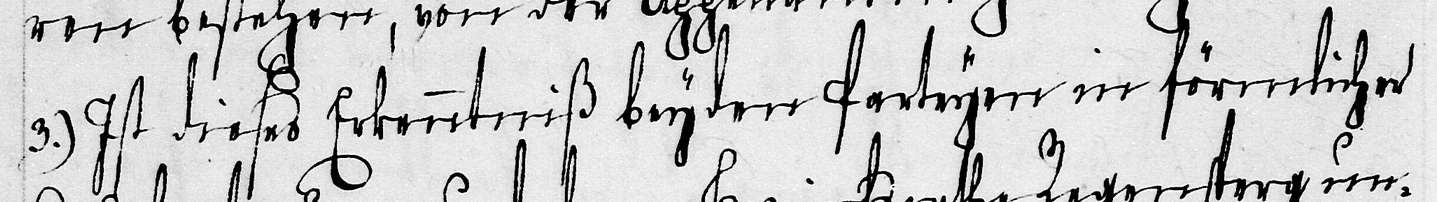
3.) Ist dieses Erkenntniß beyden Parteyen in förmlicher
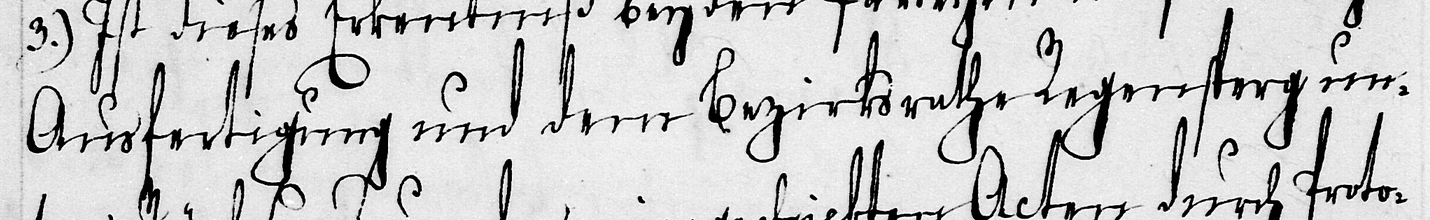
Ausfertigung und dem Bezirksrathe Regensperg un¬
